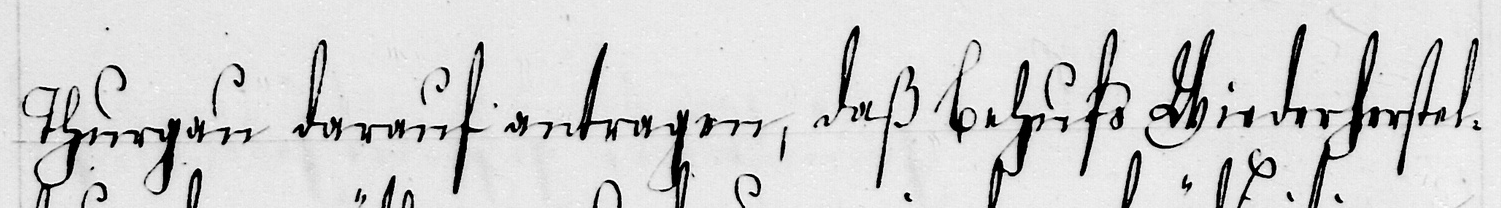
Thurgau darauf antragen, daß Behufs Wiederherste¬
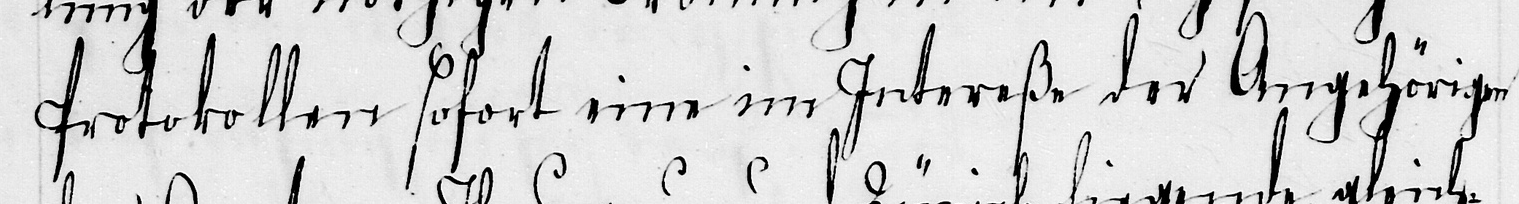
Protokollen sofort eine im Intereße der Angehörig¬
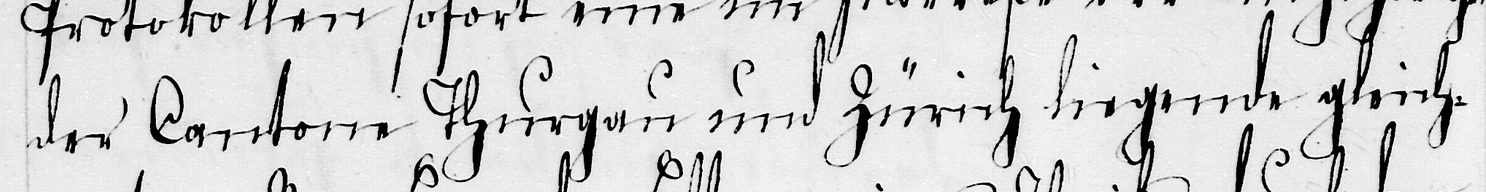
der Cantone Thurgau und Zürich liegende gleich¬
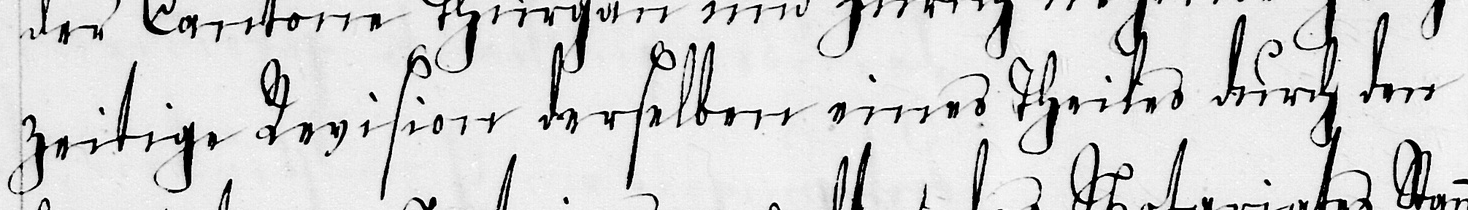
zeitige Revision derselben eines Theiles durch den
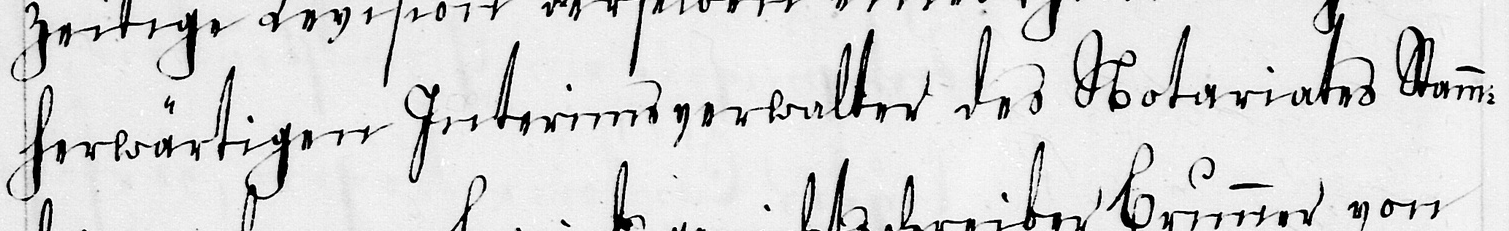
herwärtigen Interimsverwalter des Notariates Stamm¬
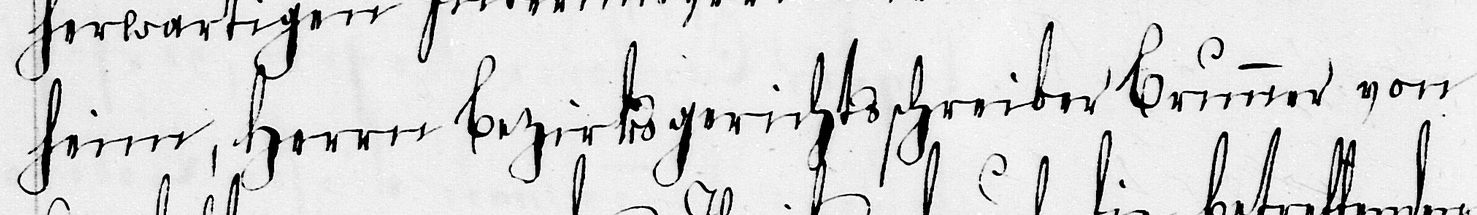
heim, Herrn Bezirksgerichtsschreiber Brunner von
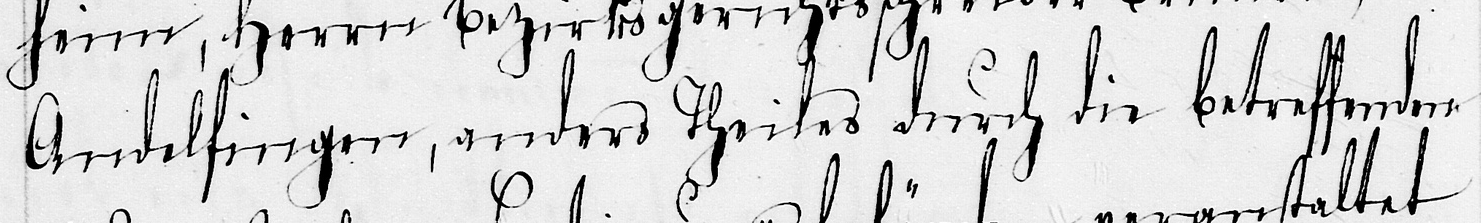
Andelfingen, anders Theiles durch die betreffenden
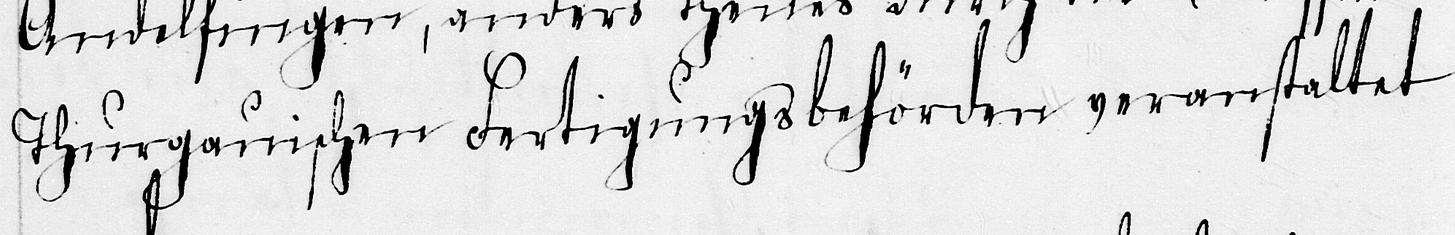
Thurgauischen Fertigungsbehörden veranstaltet
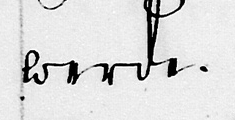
werde.
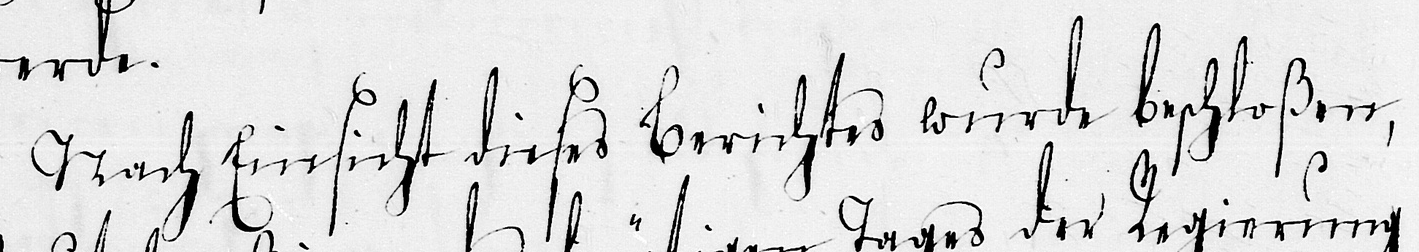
Nach Einsicht dieses Berichtes wurde beschloßen,
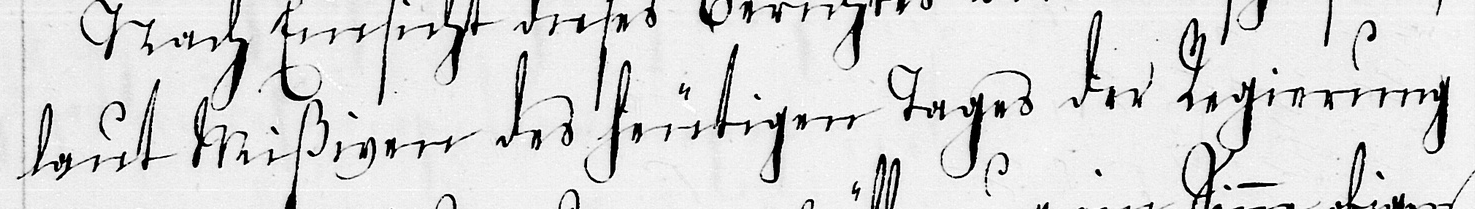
laut Mißiven des heutigen Tages der Regierung
